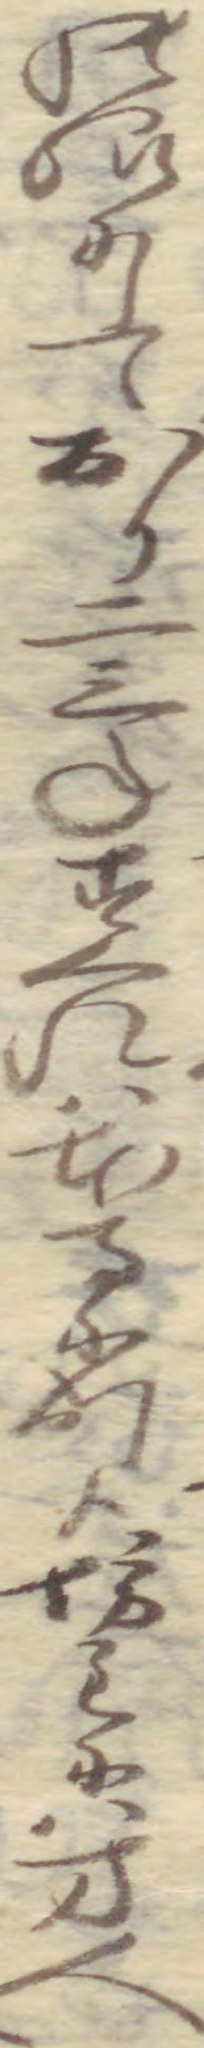の様にしておりニ三年すくれは本寺に成し候坊主には方人
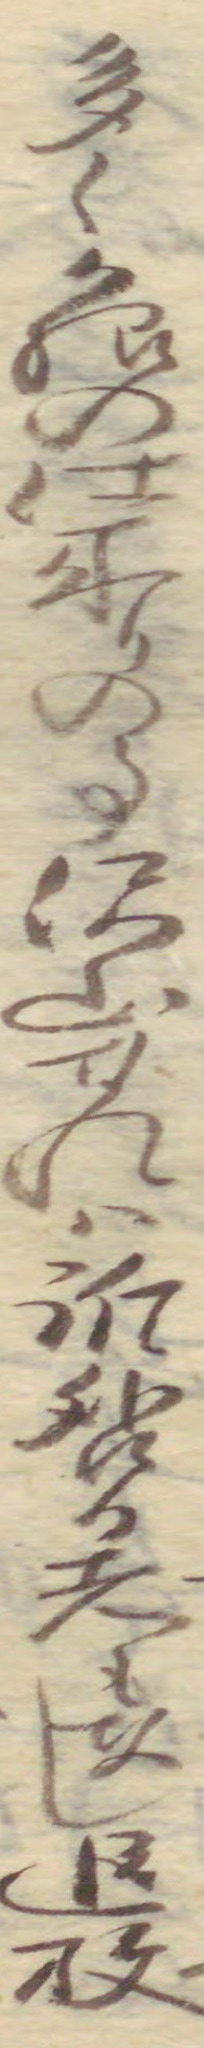多くか様の仕来りの事沢山なれは誰咎る者もなし追放
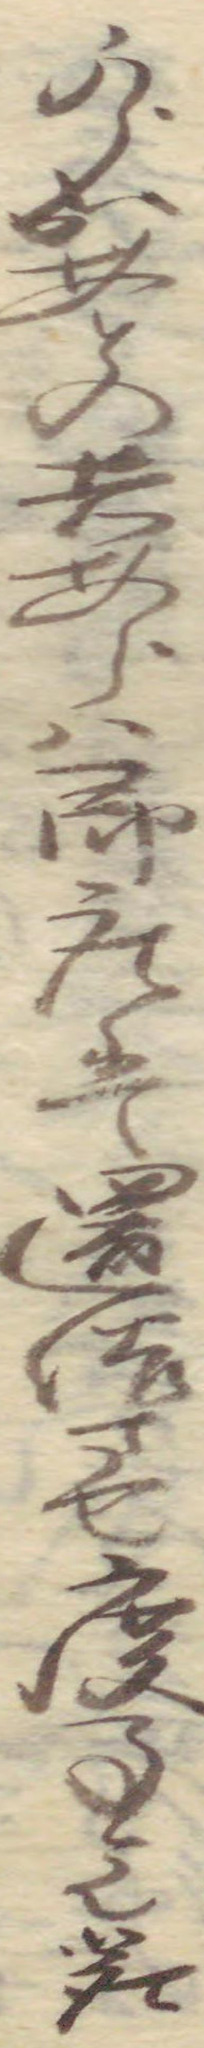可被成なとの者ならは即座にて還俗させ度事ニて御座
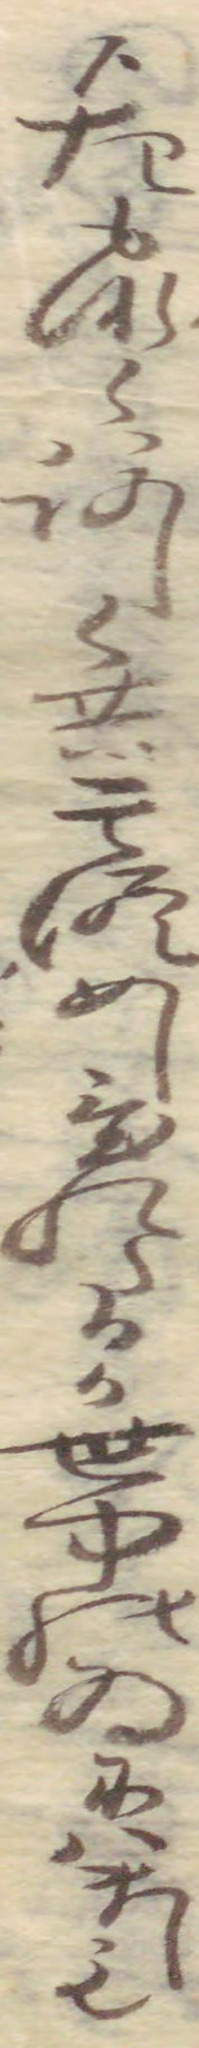候左もなくはあしく共其侭めし置れたるか世中の為にはましニて
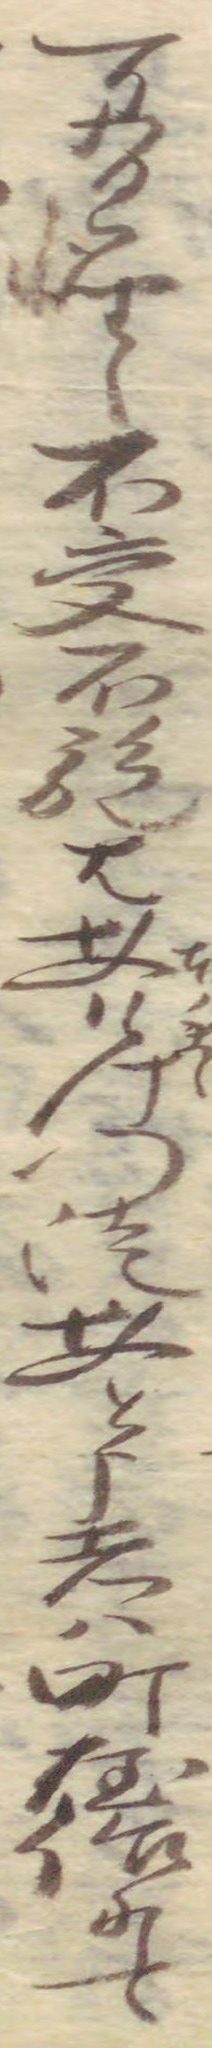可有御座候不受不施はなけけ門徒なと申者は町屋作にして
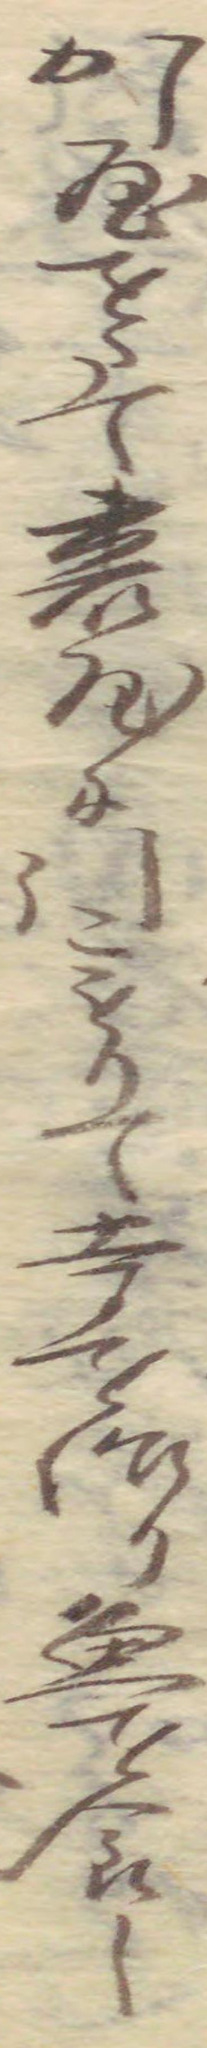かし屋をたて裏屋に引こもりて寺を作り魚を食し
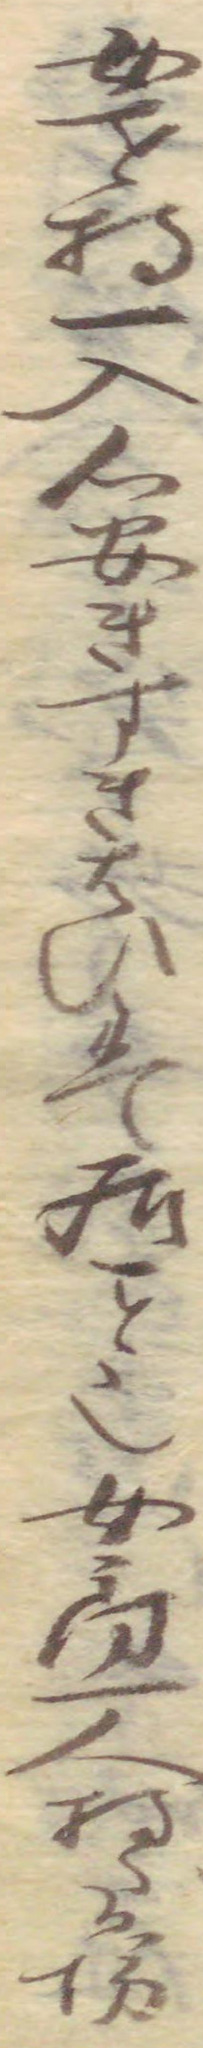女を持一入心安きすきはひにて居こと也女房一人持たる坊

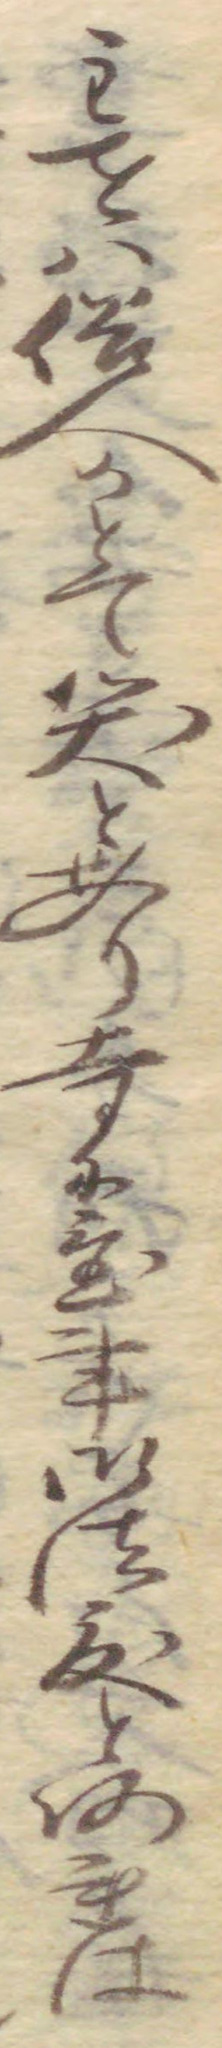主をは俗人かとて笑となり寺に置事御法度とあれは
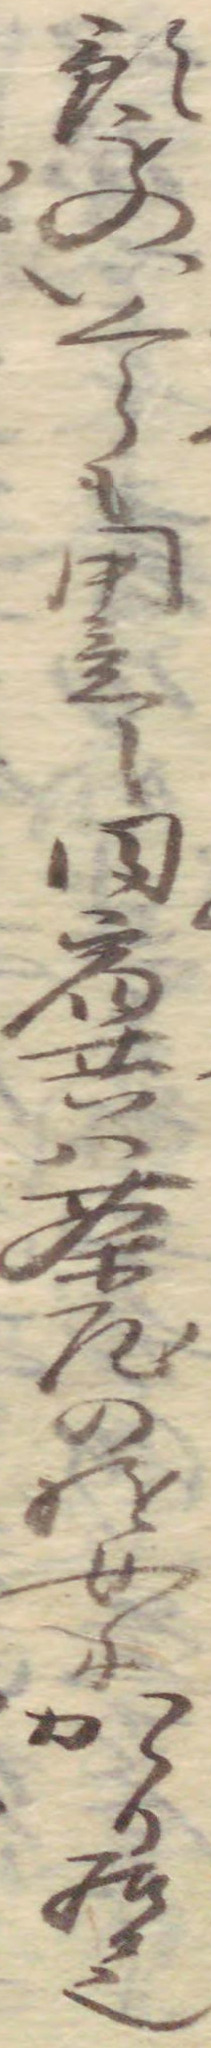預ものいくらも用意し同宿共は茶屋の遊女にかゝり居る也
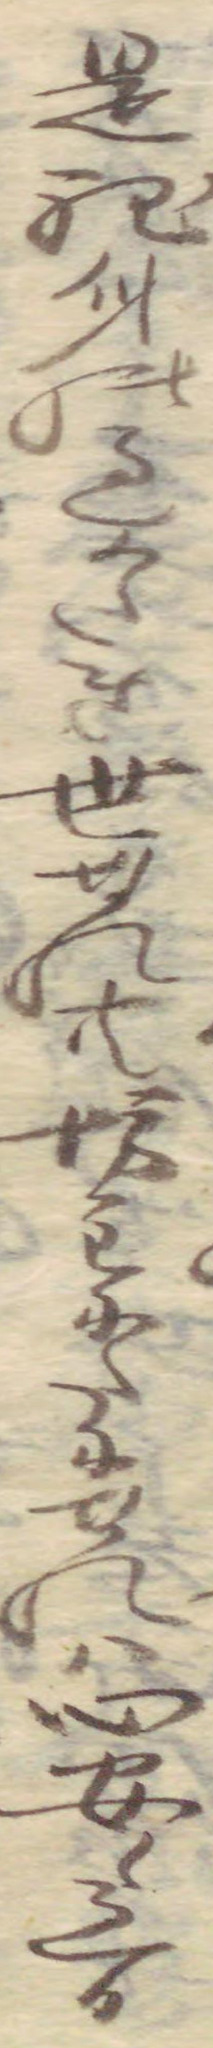是程身の過かたき世なれ共坊主にたになれは心安く過る
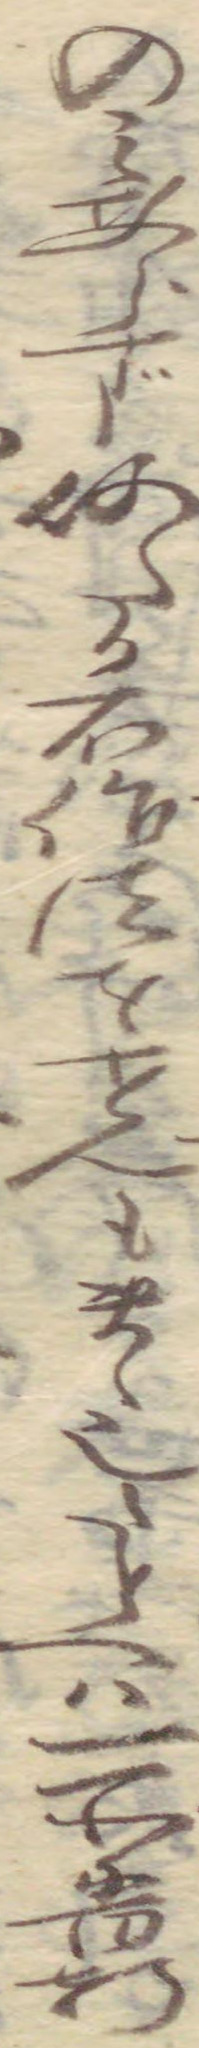のみならず何たる不作法をせんもまゝ也たとへは一所に百軒
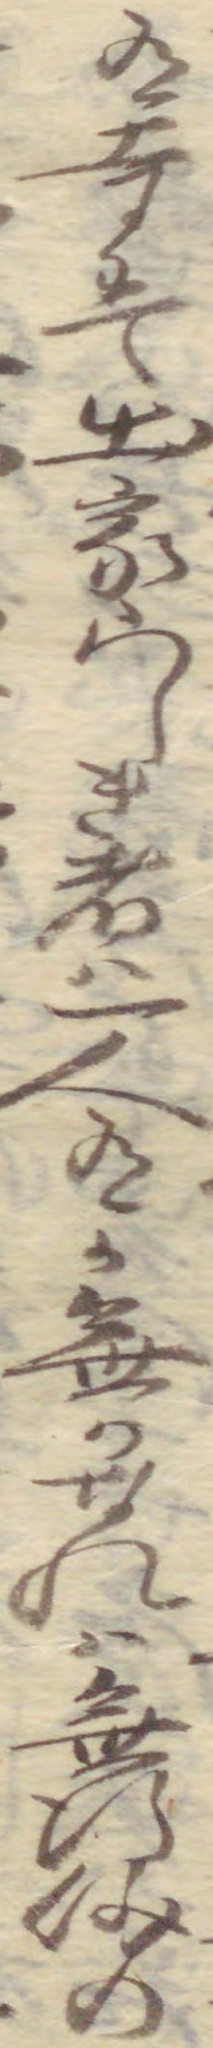有寺にて出家らしき者は一人有か無かなれは無行儀の
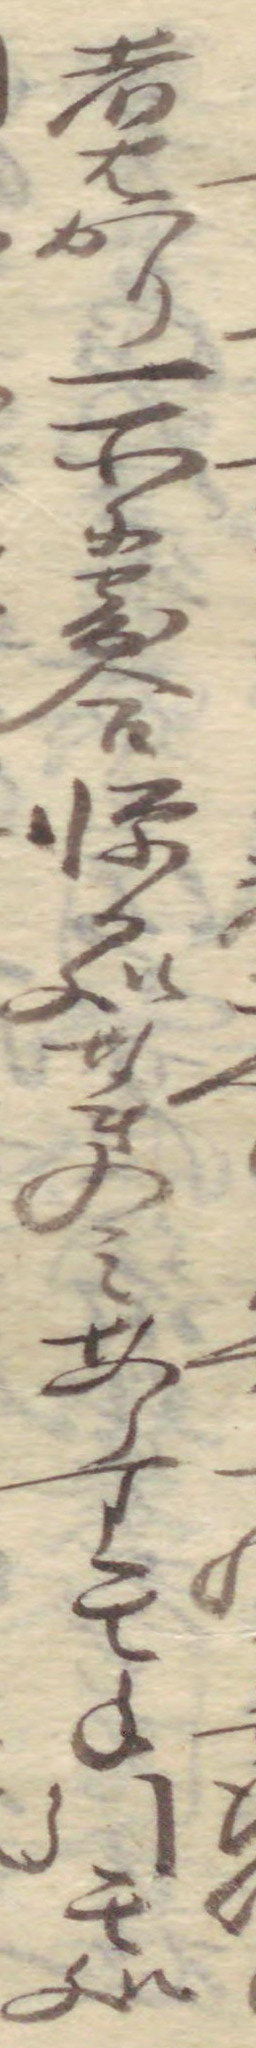者はかり一所に寄合憚る処なきのみならす其手引其処
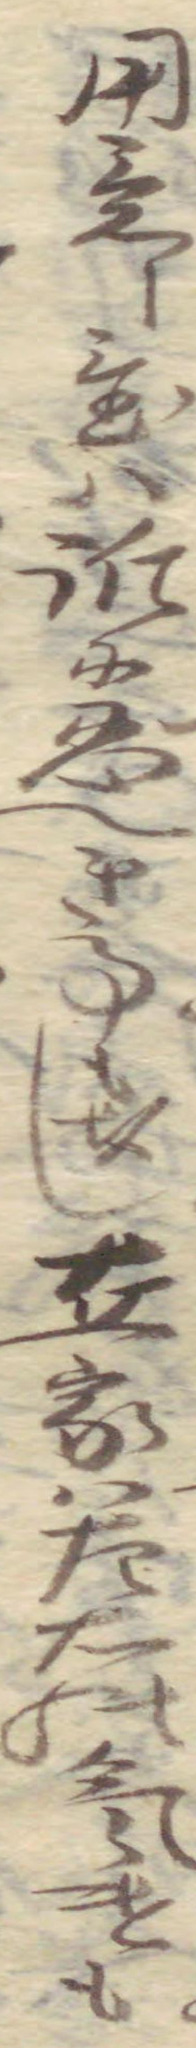用意し置は誰に忍へき事もなし在家は左右の気遣も
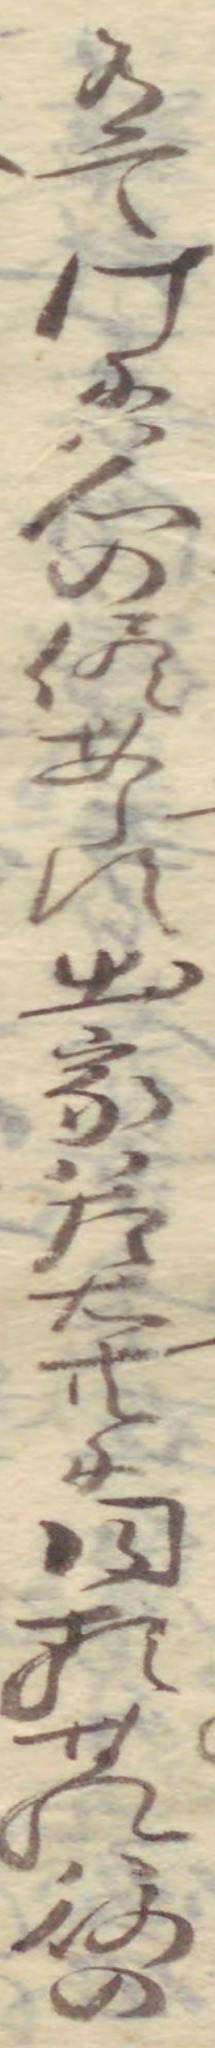有てけには心の侭ならす出家は左右共に同類なれは何の
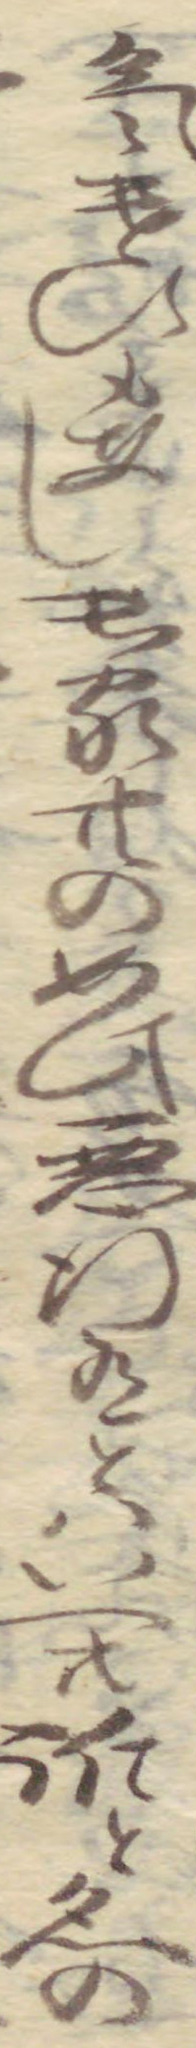気遣ひもなし出家共の如此悪行有とはいへ共誰と名の
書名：鶯宿雑記. 巻263-264
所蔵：国立国会図書館 National Diet Library, JAPAN
